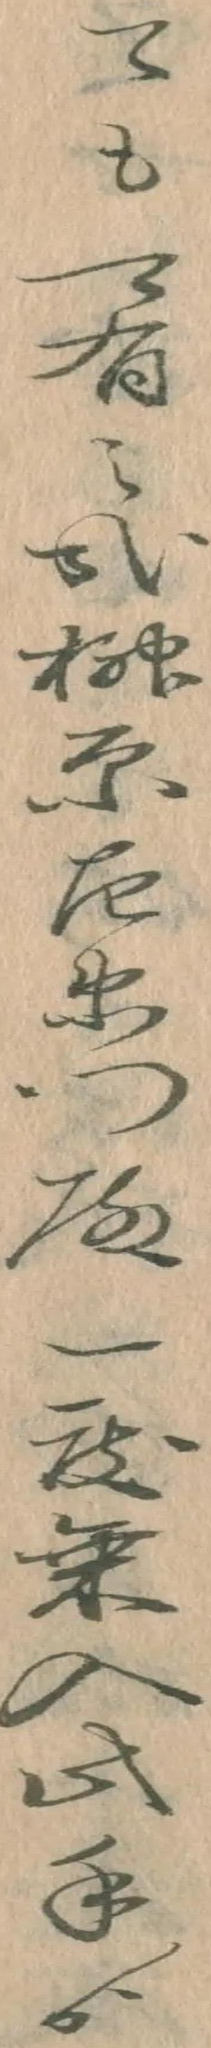ても可有之哉榊原左衛門殿一度乗入此手ゟ
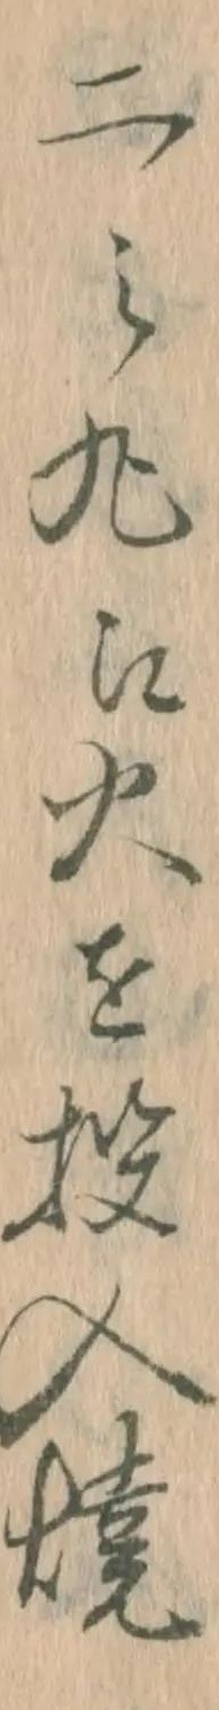二之丸江火を投入焼
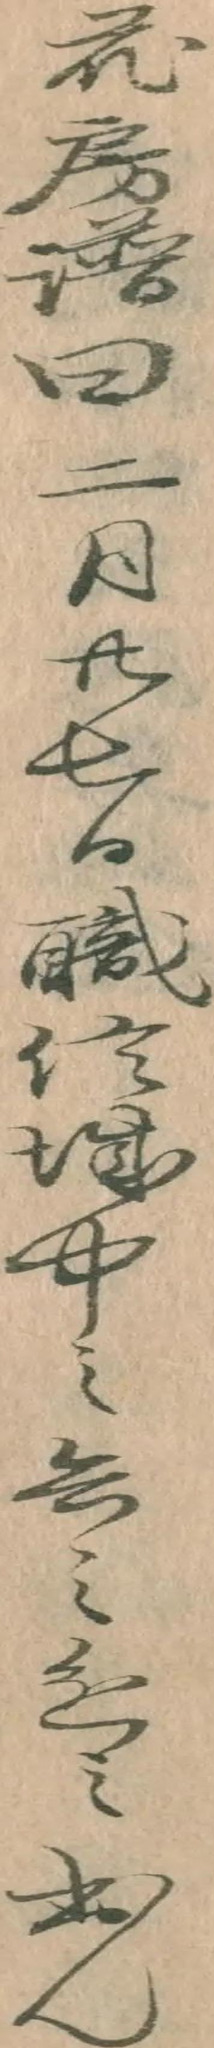花房譜曰二月廿七日職信城中之兵之進み出ん
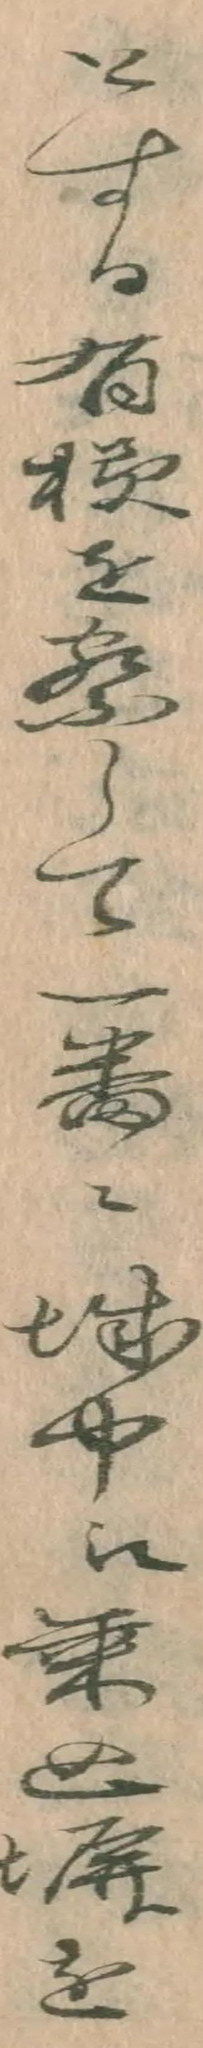とする有様を察して一番に城中江乗込塀を
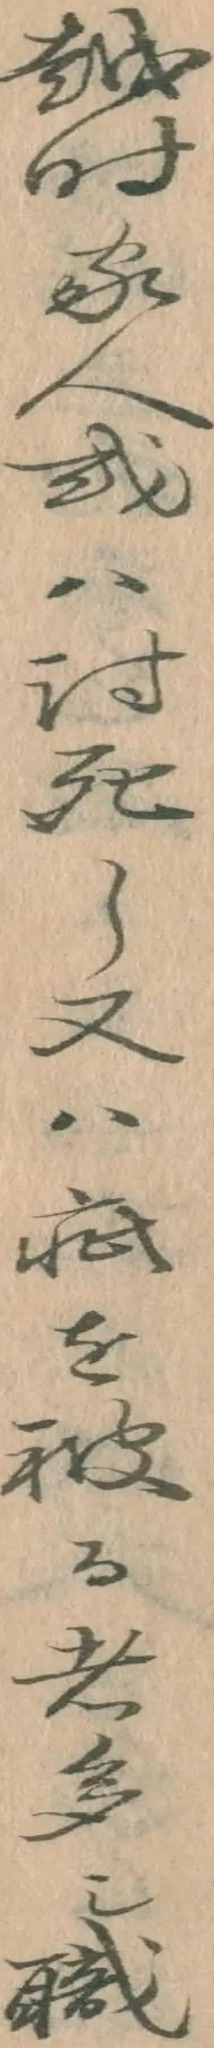越時家人或は討死し又は疵を被る者多し職
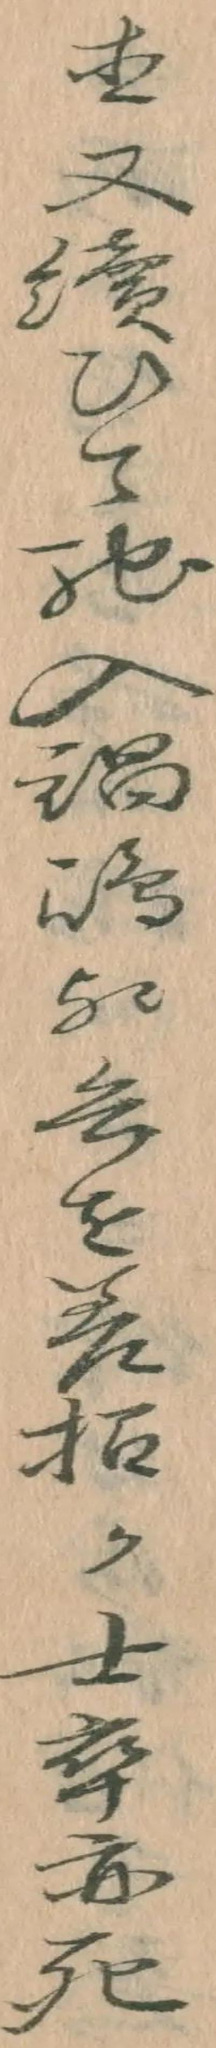直又続ひて馳入鍋島歟兵を差招く士卒亦死
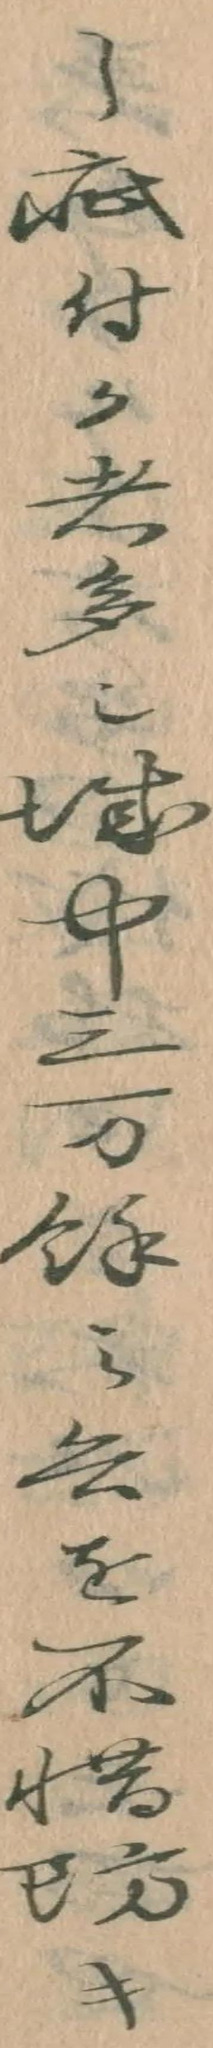し疵付く者多し城中三万余之兵を不惜防き
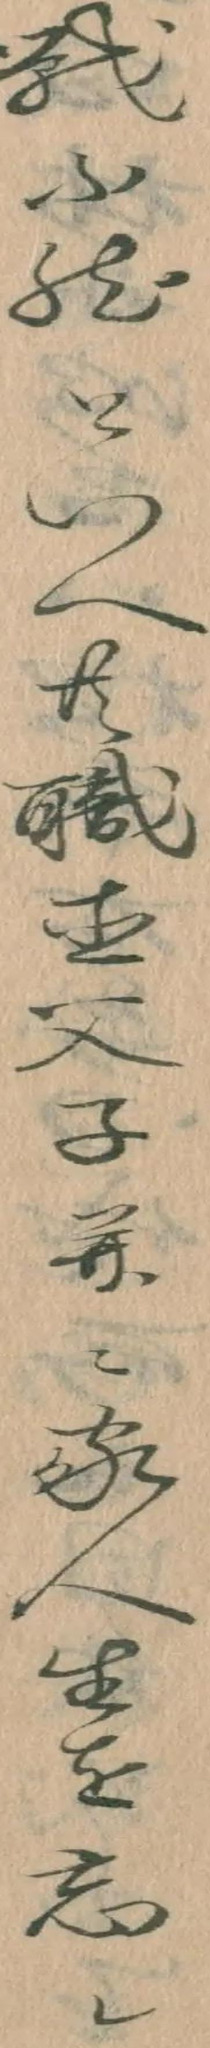戦ふ然といへ共職直父子幷に家人生を忘し
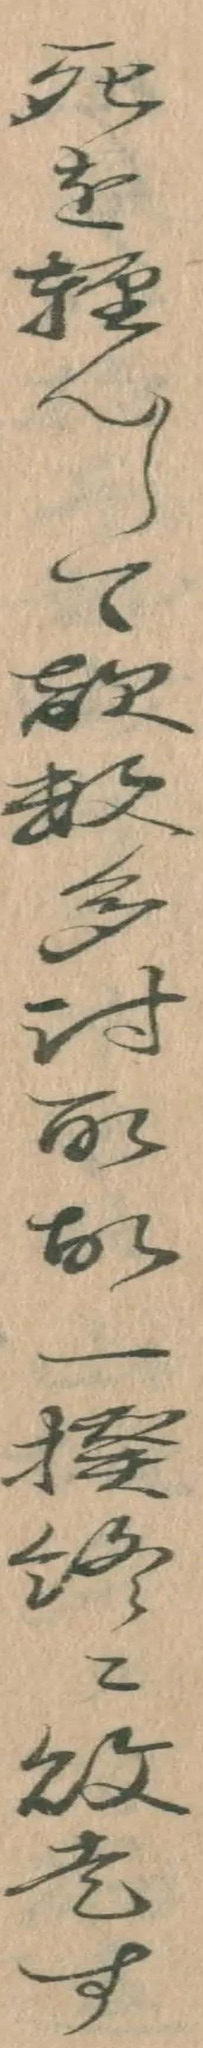死を軽んして敵数多討取故一揆終に敗走す
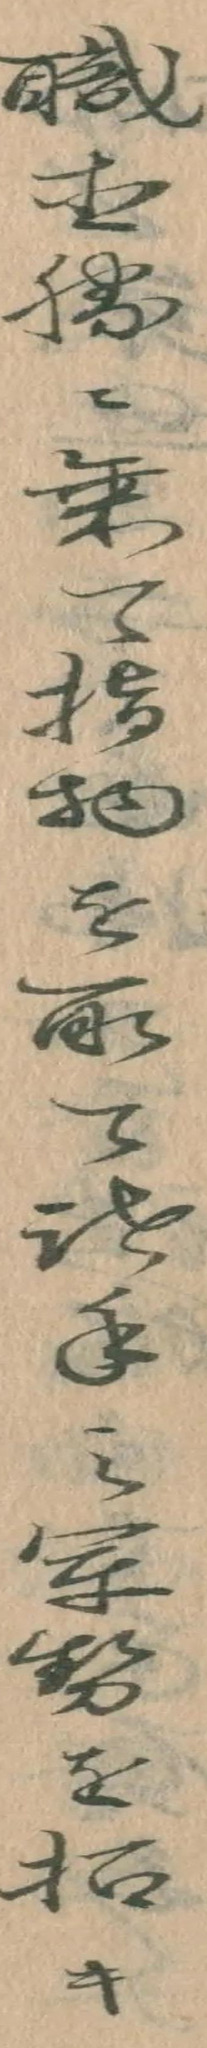職直勝に乗て指物を取て諸手之軍勢を招き
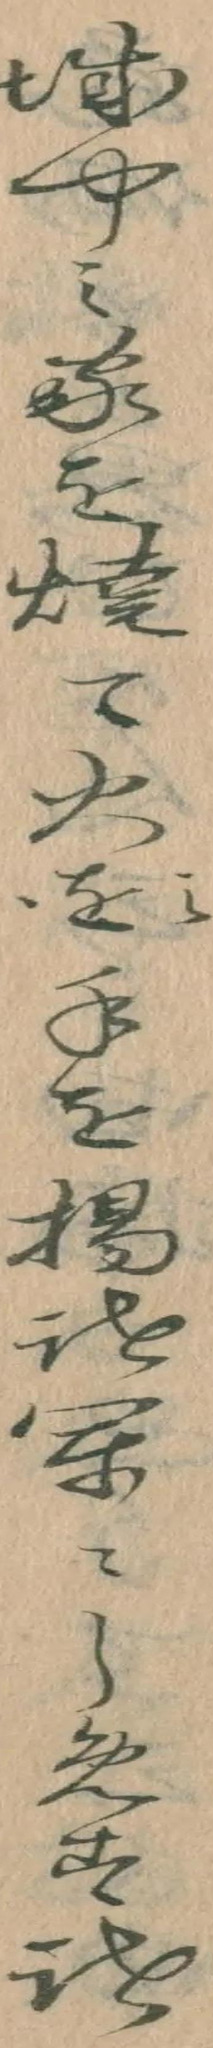城中之家を焼て火を手を揚諸軍にし免春諸
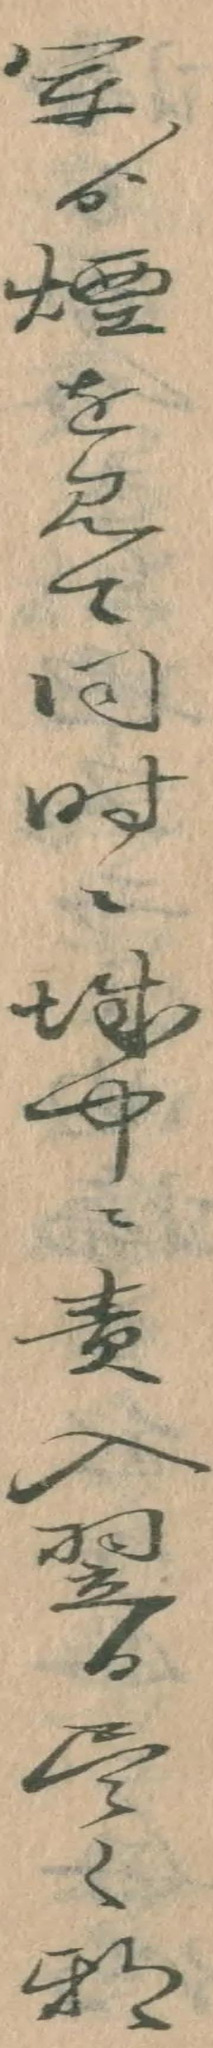軍ゟ煙を見て同時に城中に責入翌日尽く邪
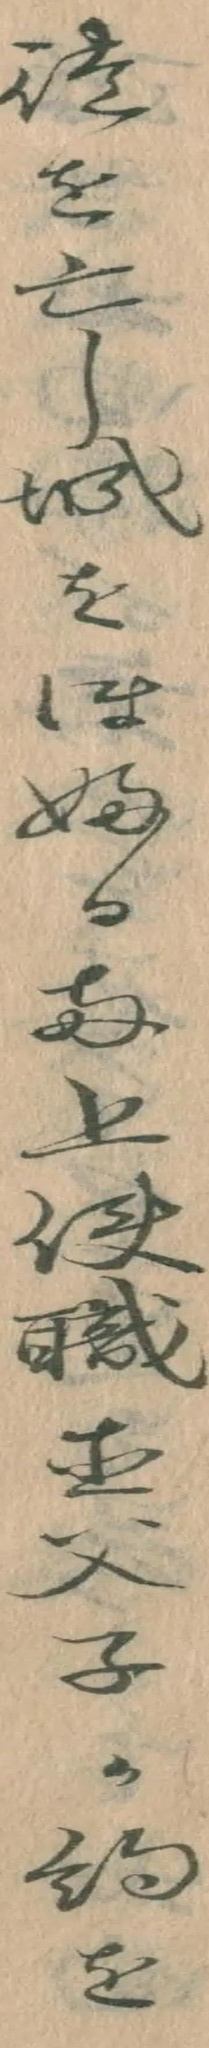徒を亡し城をほ婦る両上使職直父子か約を
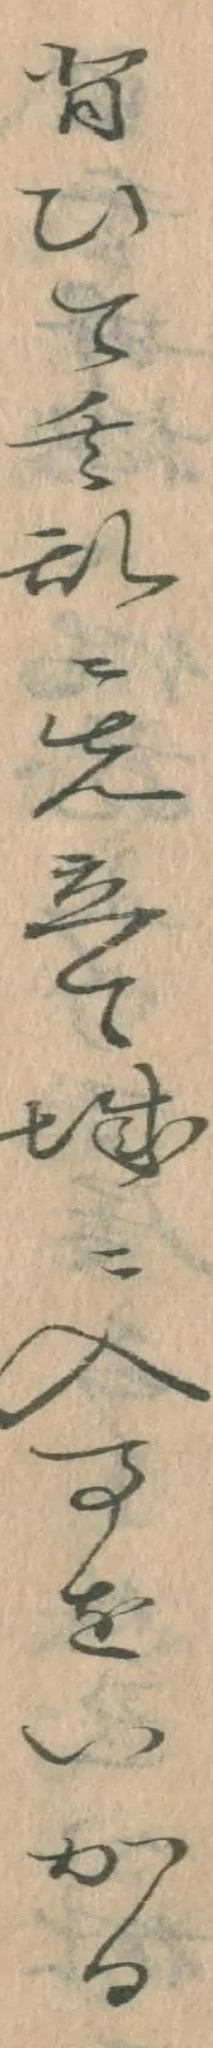背ひて其乱に先立て城に入事をいかる
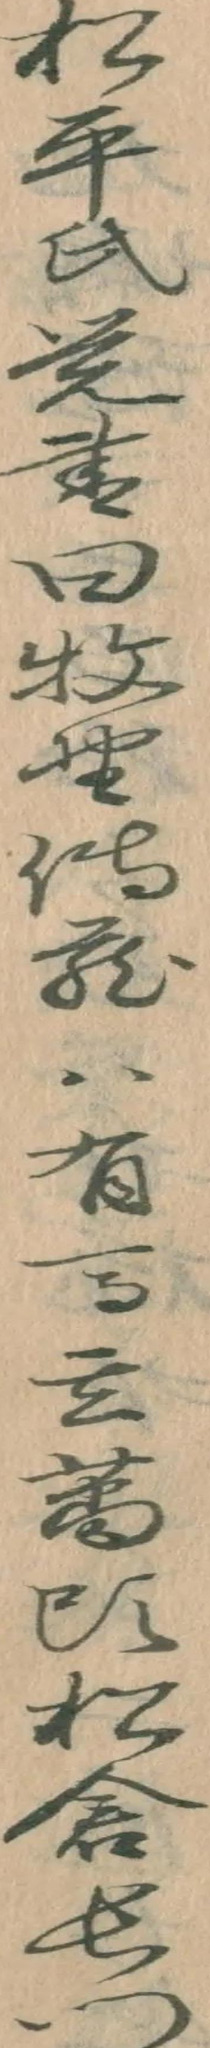松平氏覚書曰牧野伝蔵は有馬玄蕃頭松倉長門
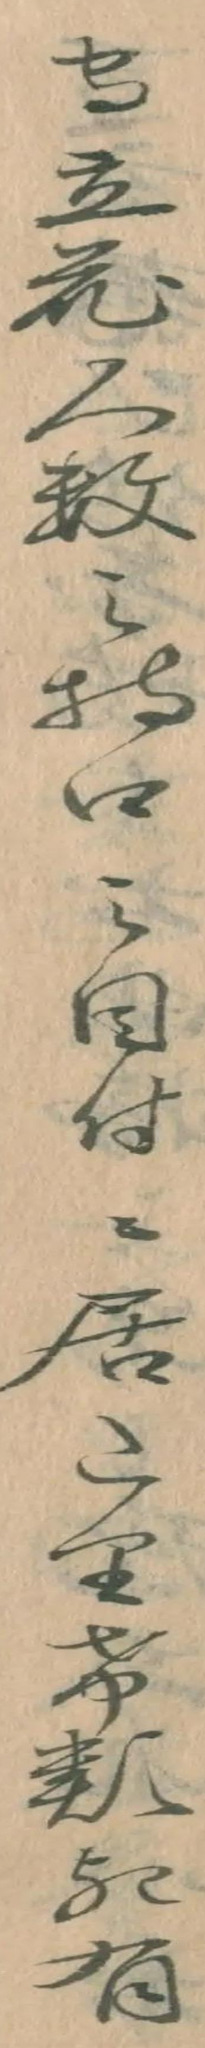守立花人数之持口之目付に居た里希類歟有
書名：切支丹御退治記 49巻. [8]
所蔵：国立国会図書館 National Diet Library, JAPAN
